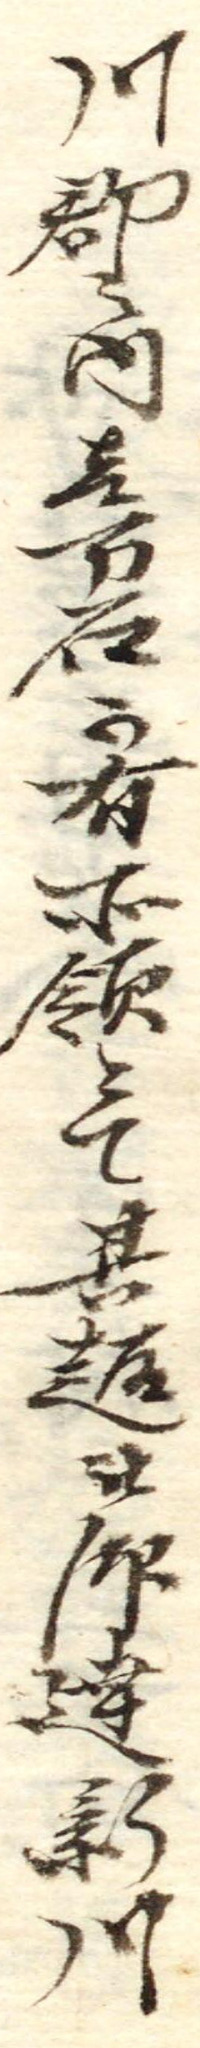川郡之内壱万石可有所領とて其趣被仰達新川
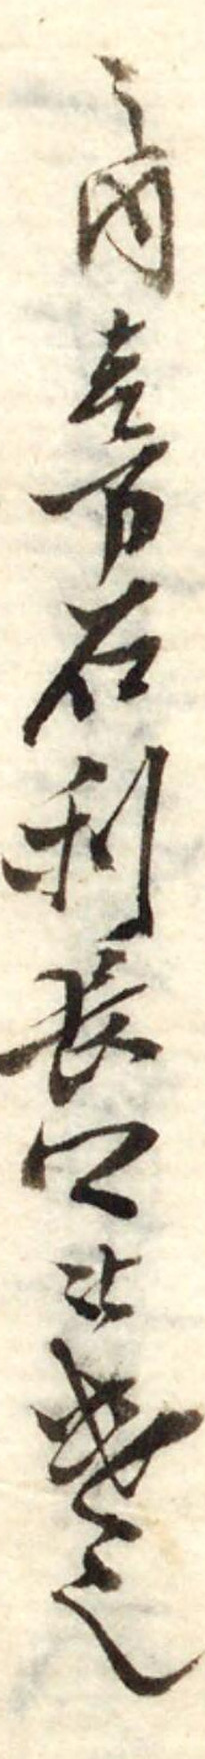之内壱万石利長郷被遣也
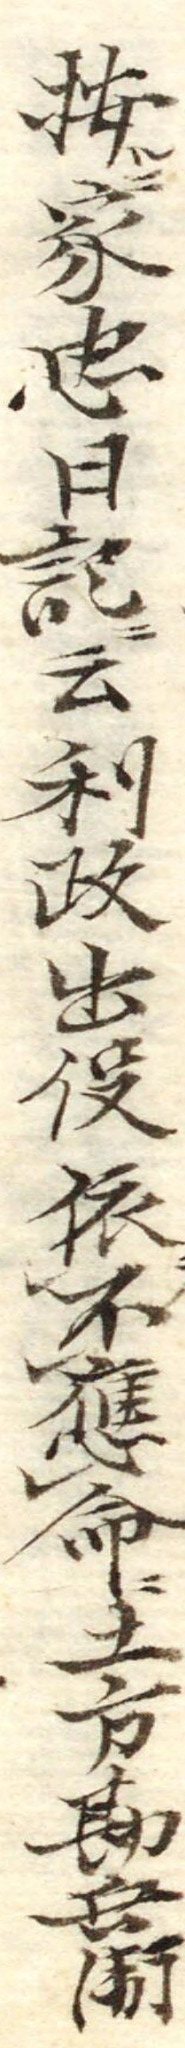按るに家忠日記に云利政出役依て不應命に土方勘兵衛
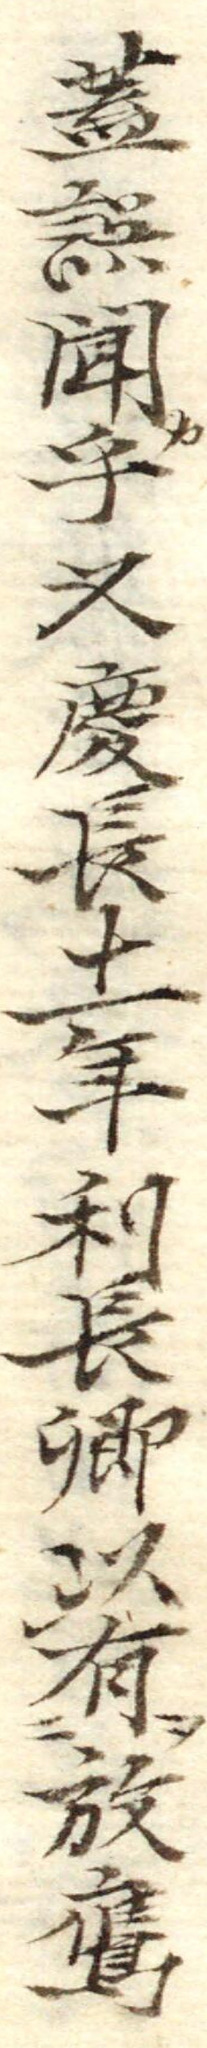蓋誤聞か乎又慶長十一年利長卿以有を放鷹

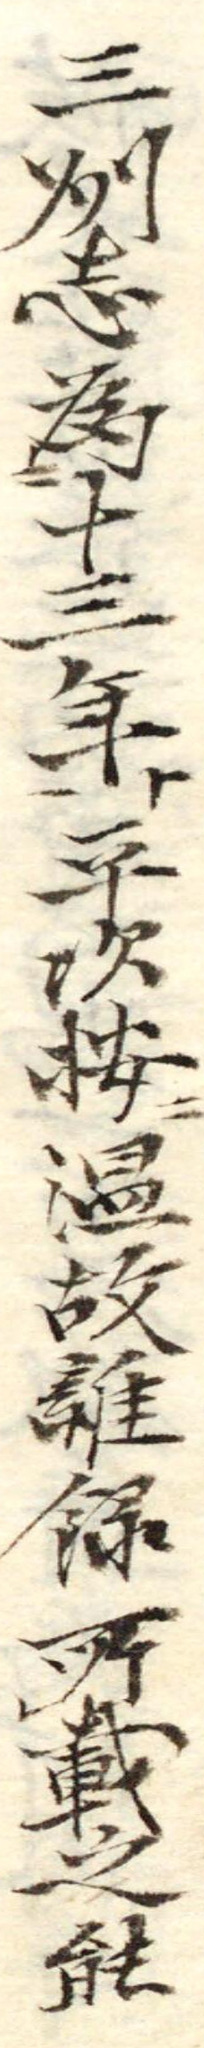三州志為十三年と平次按に温故維録所載之能
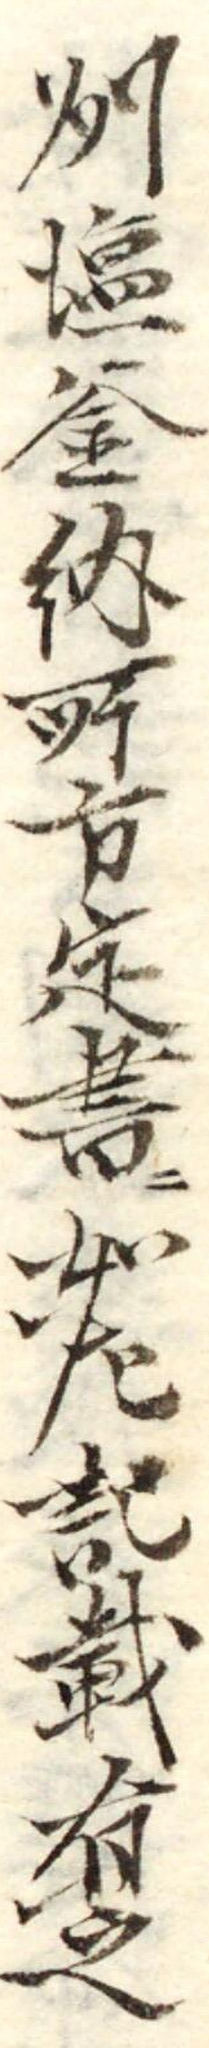州塩釜納所方定書に如左記載有之
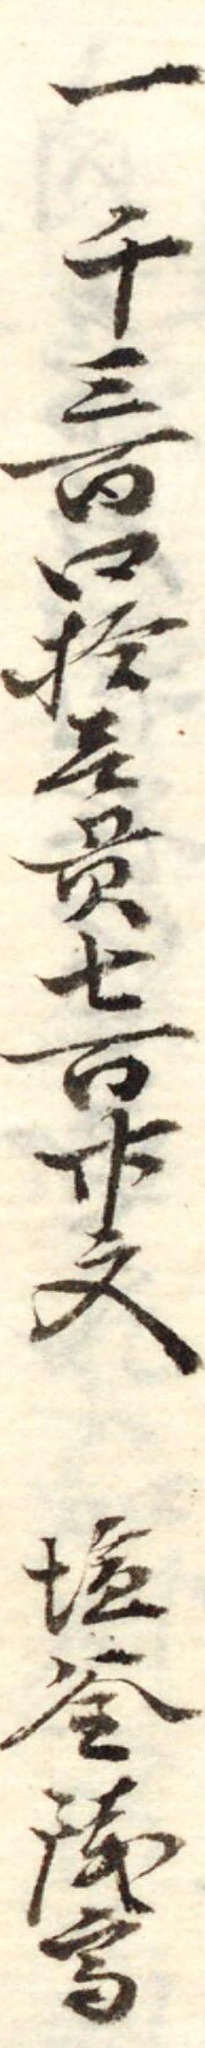一千三百四拾壱貫七百廿文塩釜残高
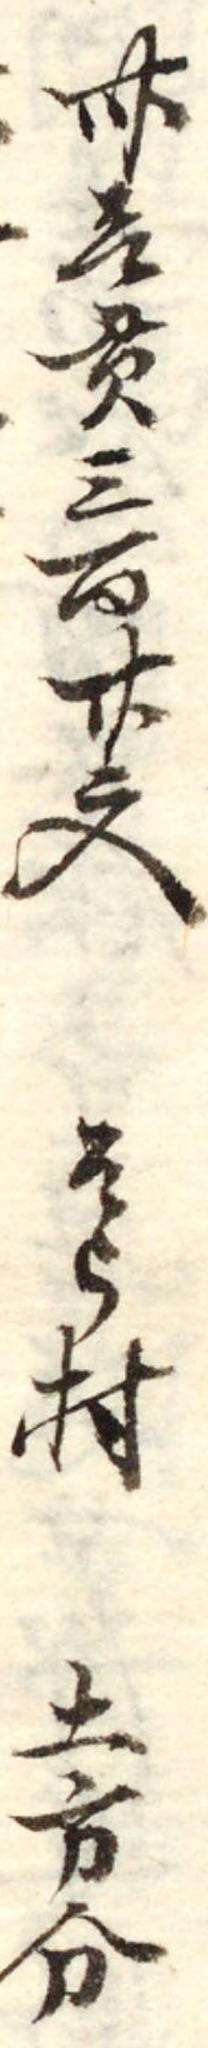丗壱貫三百廿文そら村土方分
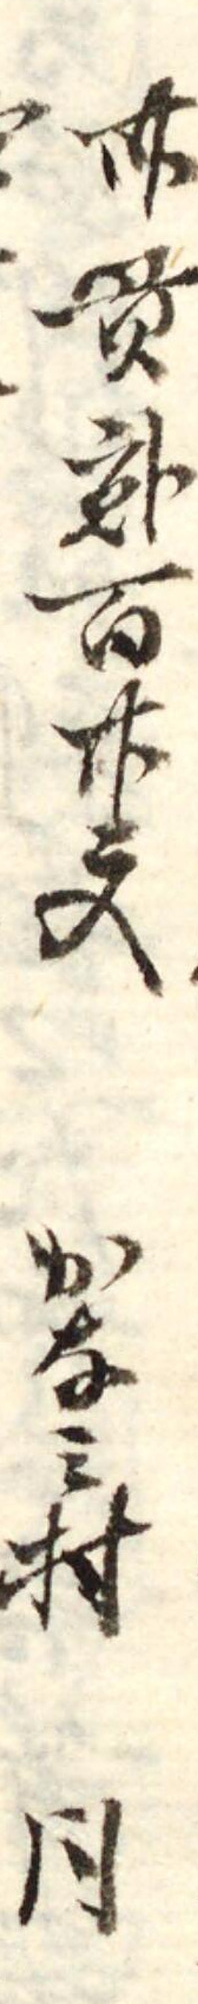丗貫貳百廿文かなみ村同
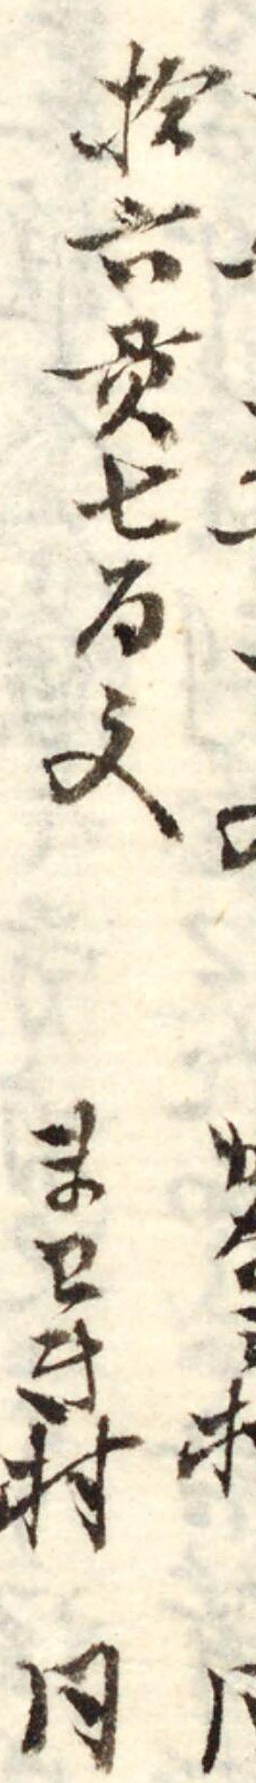拾六貫七百文ま已き村同
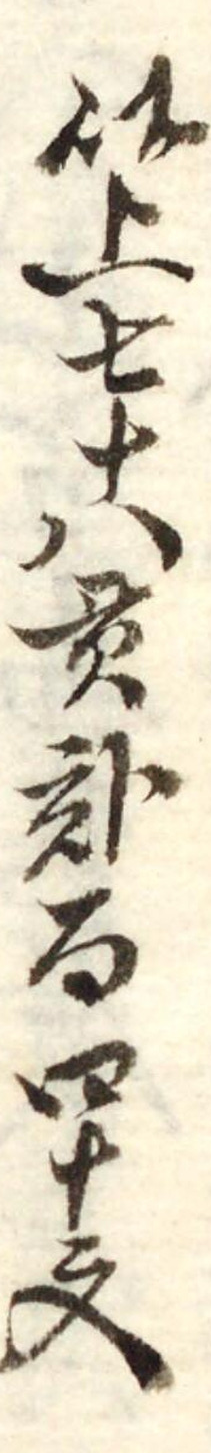以上七十八貫貳百四十文
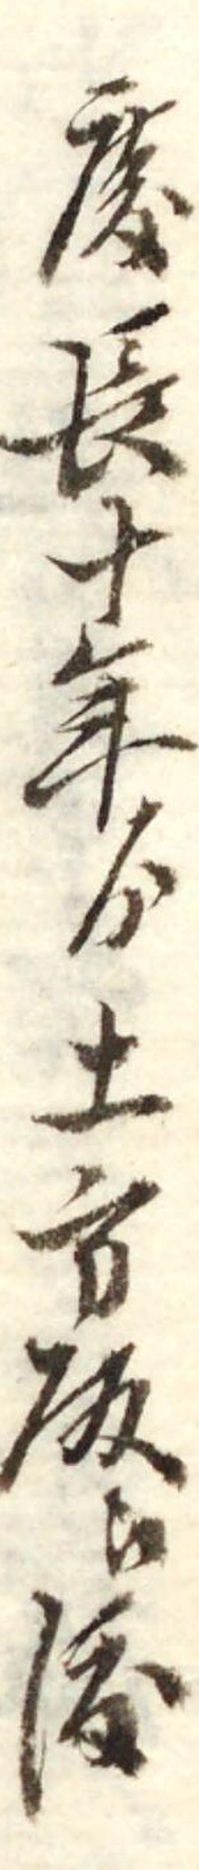慶長十年ゟ土方殿江渡
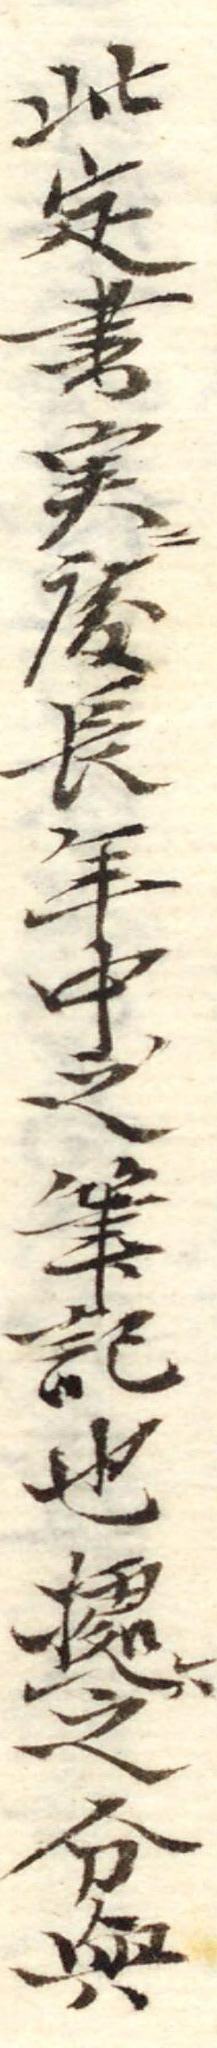此定書実に慶長年中之筆記也據れは之分與
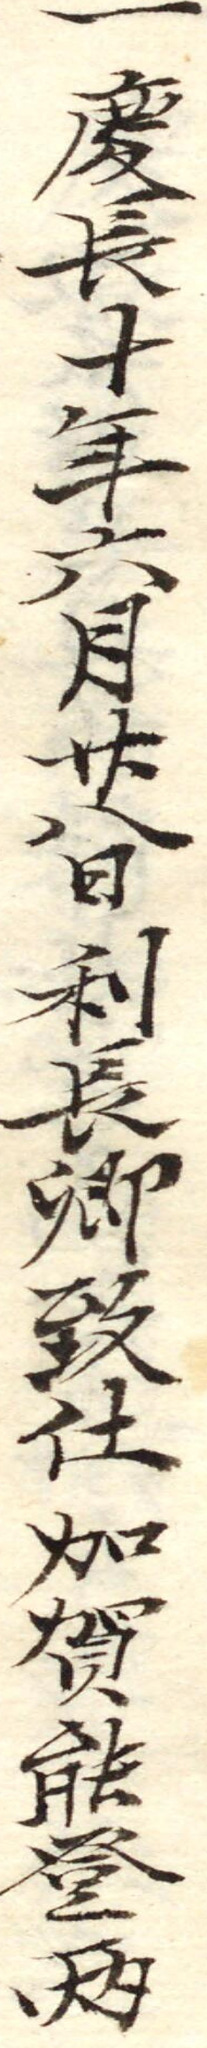一慶長十年六月廿八日利長卿致仕加賀能登両
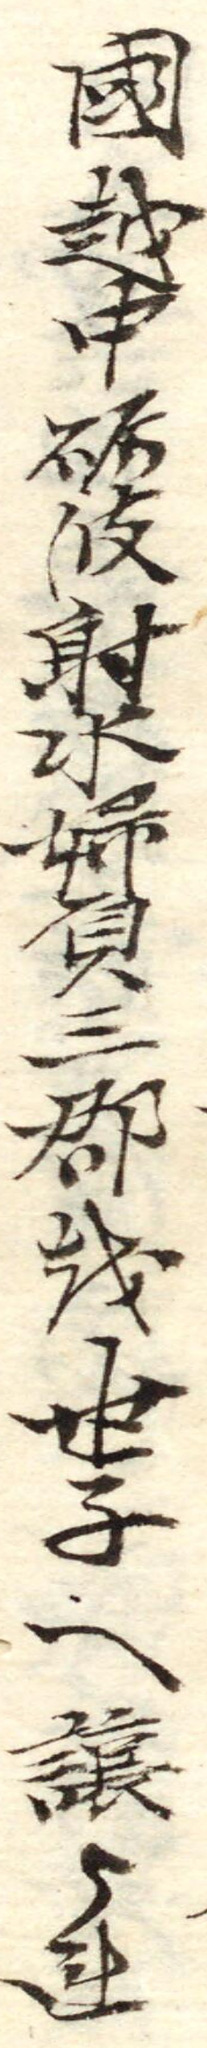国越中砺波射水婦負三郡越世子へ譲ら連
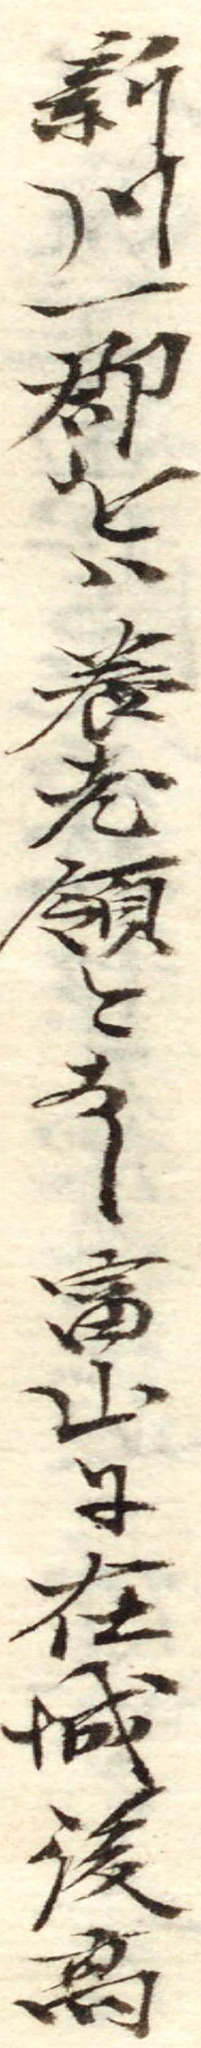新川一郡をは養老領となし富山尓在城後高
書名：前田家封国証書集録
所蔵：Ishikawa Prefectural Library
